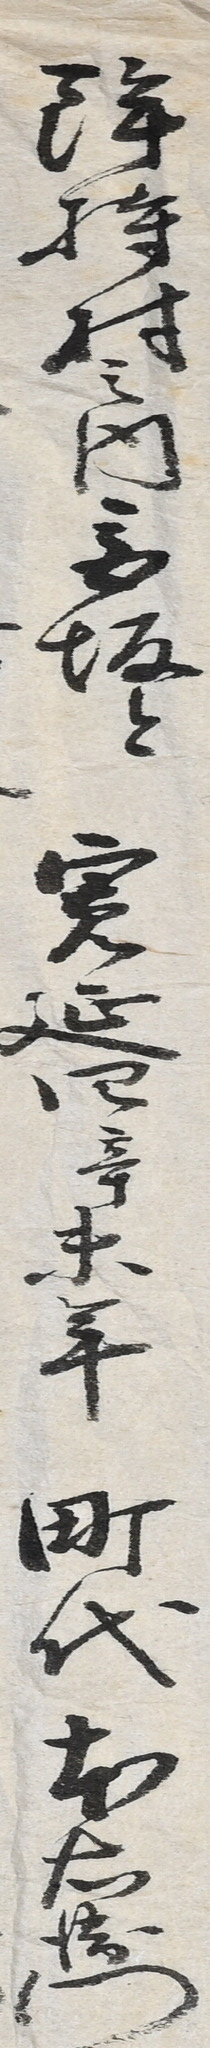鉾持村之内宮坂と寛延四辛未年町代本右衛門
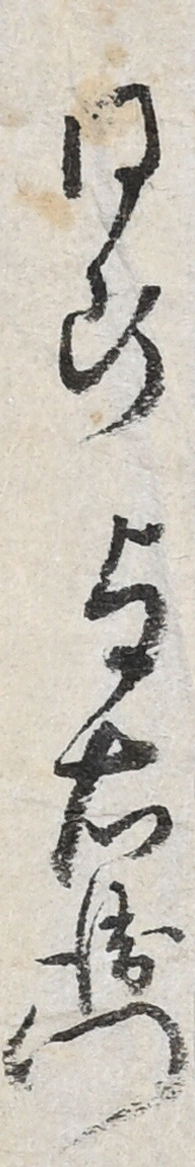同断藤右衛門
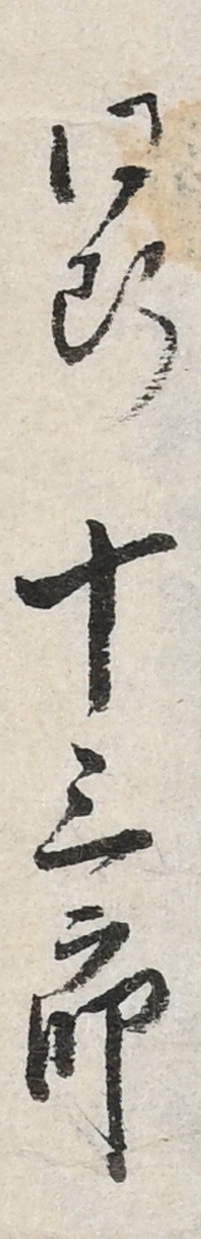同断十三郎
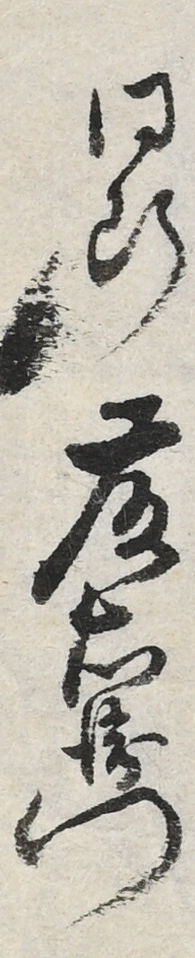同断藤右衛門
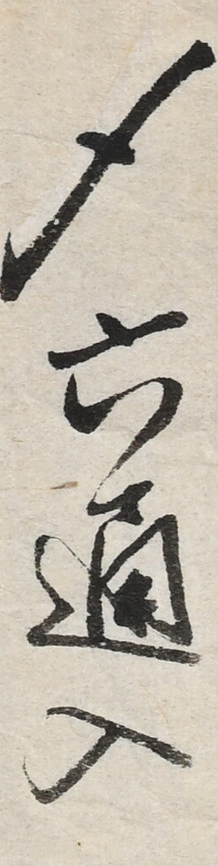〆六通入

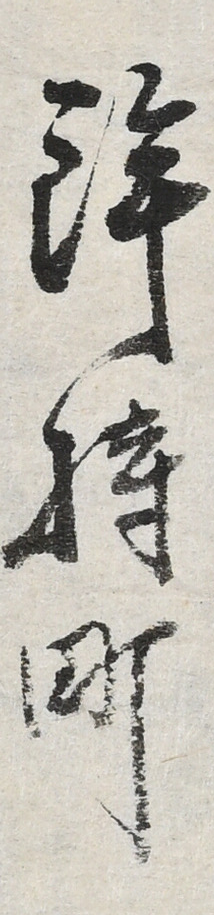鉾持町

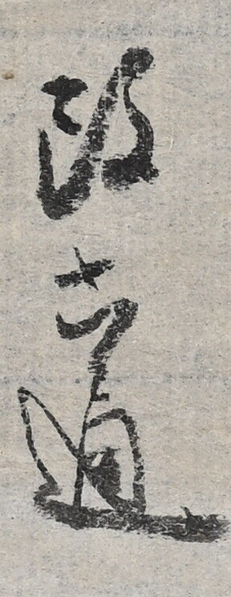改六通
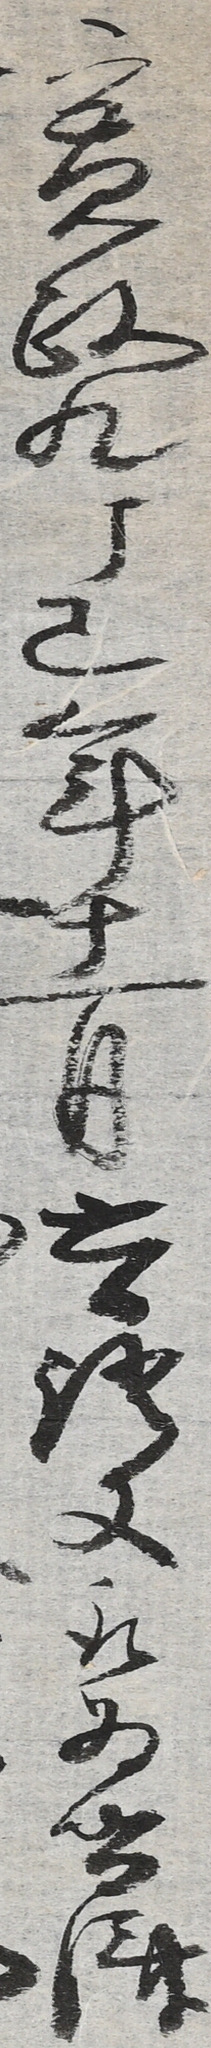寛政九年丁巳年十一月六日証文取為替済

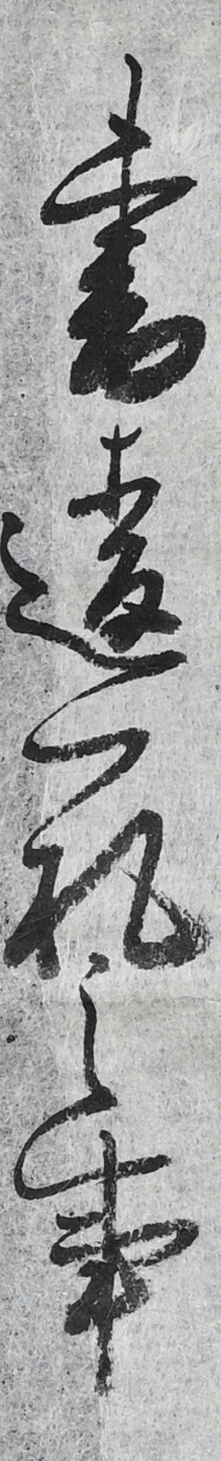書違一札之事
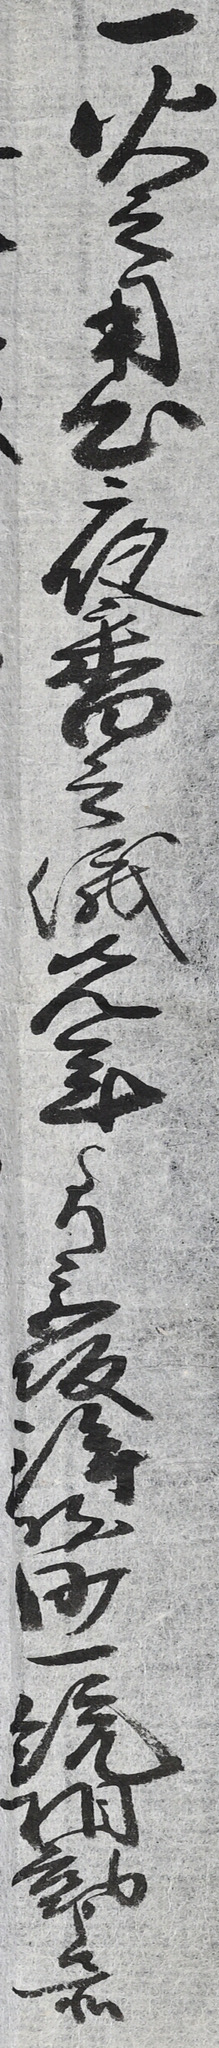一火之用心夜番之儀先年より宮坂鉾持町一統相勤申候所
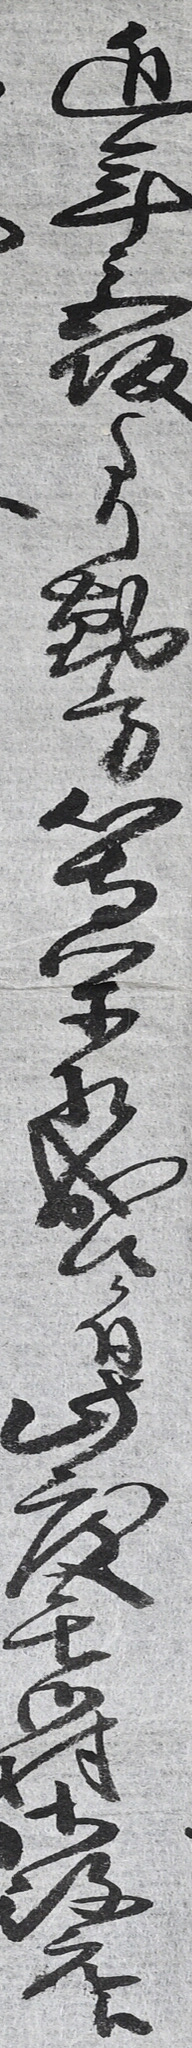近年宮坂より勤方等閑相成候ニ付此度其御村御役元え
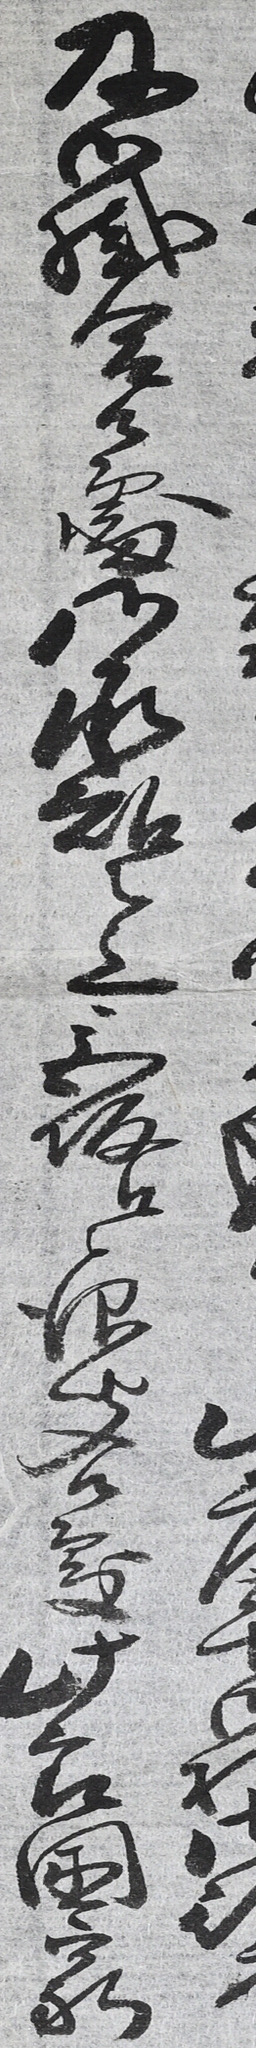及御掛合候処御承知之上宮坂え被仰聞候処此節困窮
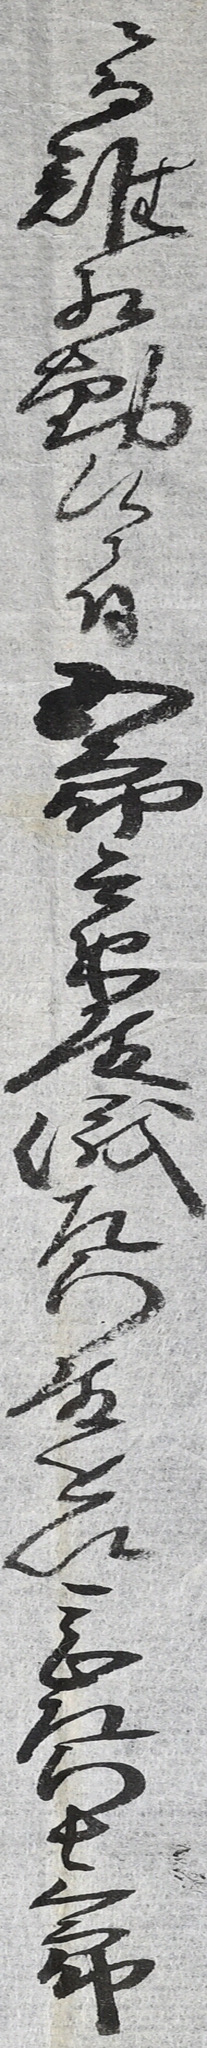ニ而難相勤候ニ付五郎兵衛殿儀左衛門殿を以甚左衛門十三郎
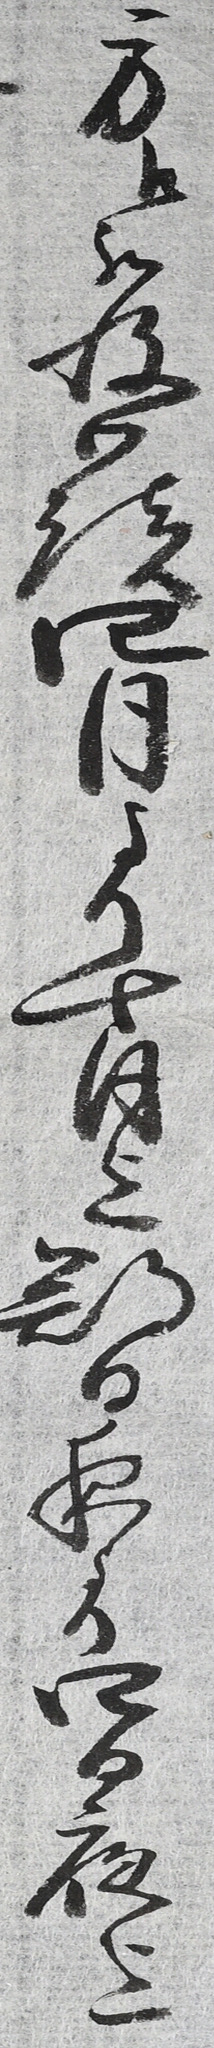方え被及御談四月より十月迄朔日夜より四日夜迄
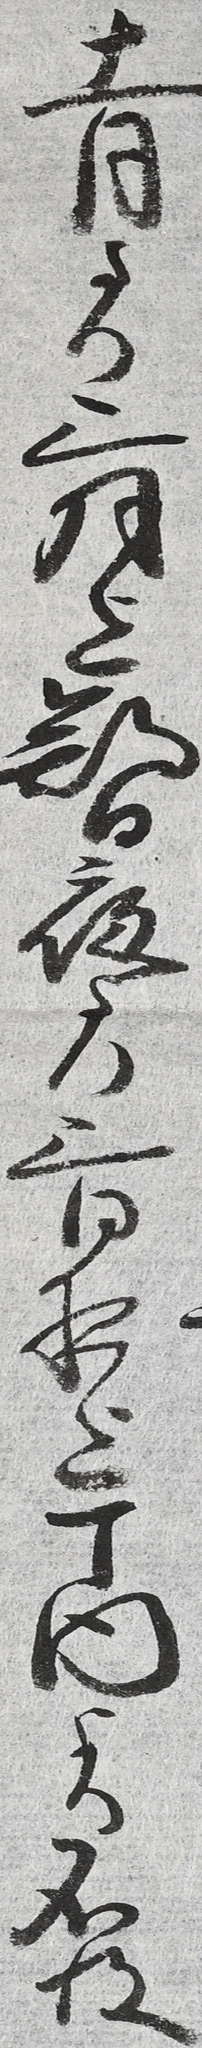十一月より三月迄朔日夜より三日夜迄町内より不及
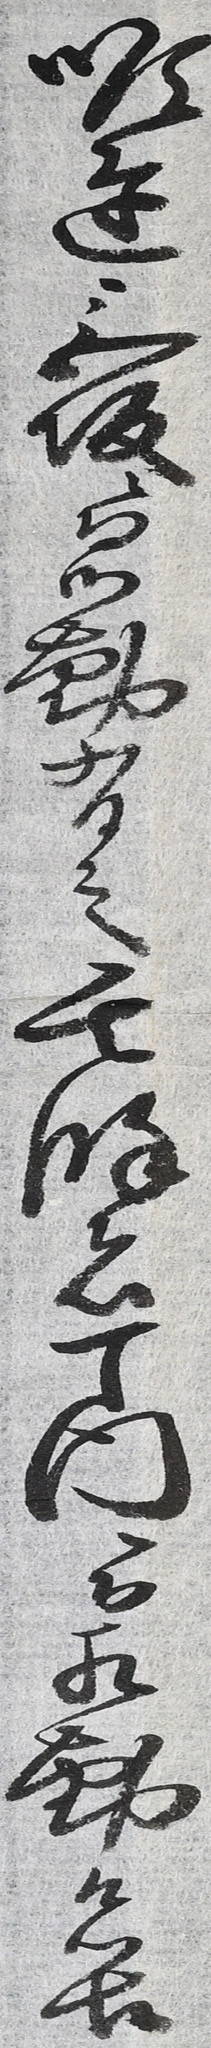順達宮坂ニ而御勤有之其余は町内ニ而相勤候筈
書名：書違一札之事
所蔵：伊那市立高遠町図書館・合同会社AMANE
